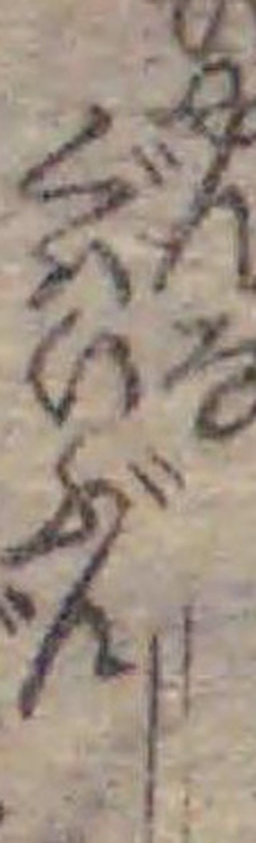ぐはいぶん
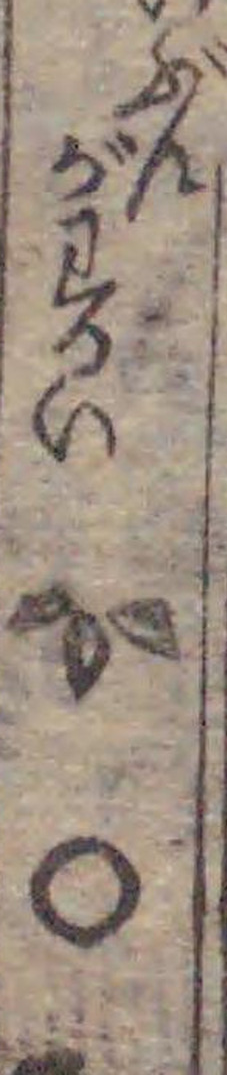がわるい
